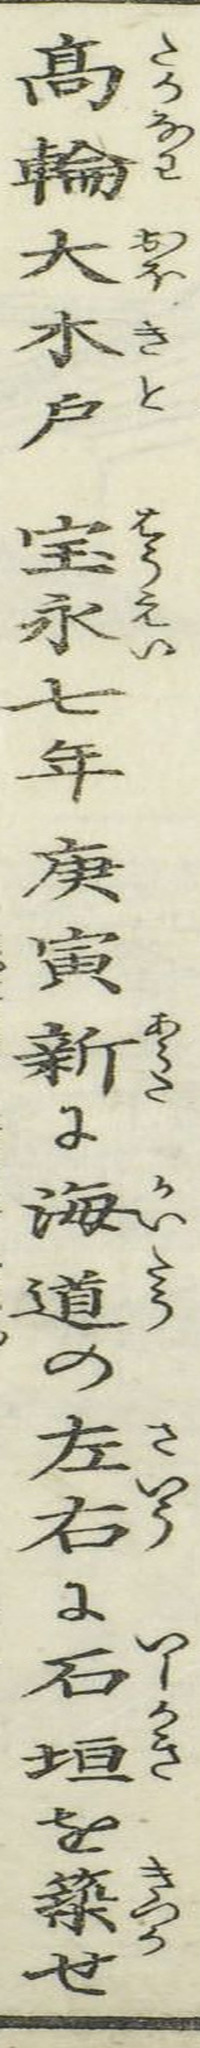高輪大木戸宝永七年庚寅新に海道の左右に石垣を築せ
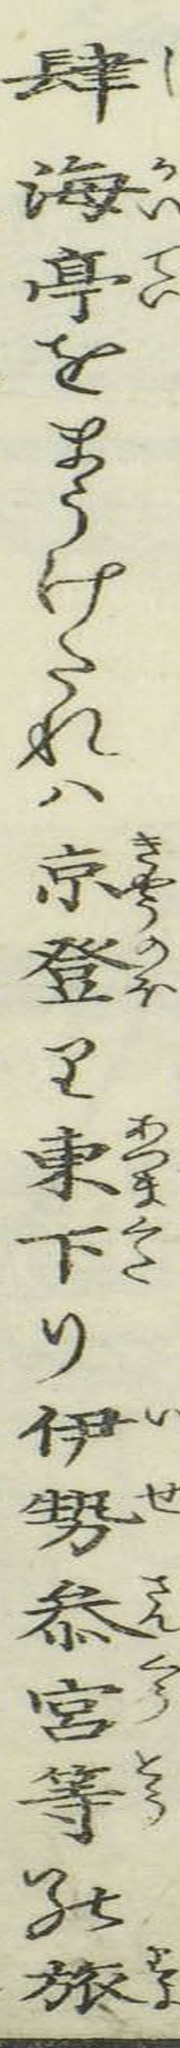肆海亭をまうけたれは京登り東下り伊勢参宮等の旅
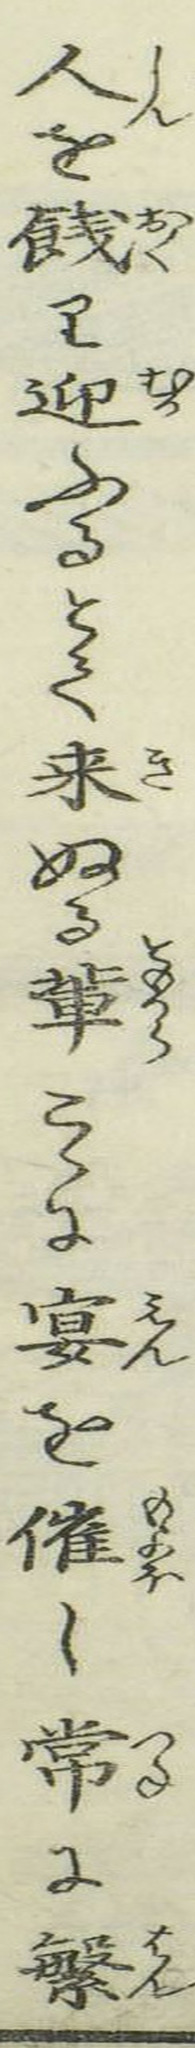人を餞り迎ふるとて来ぬる輩こゝに宴を催し常に繁

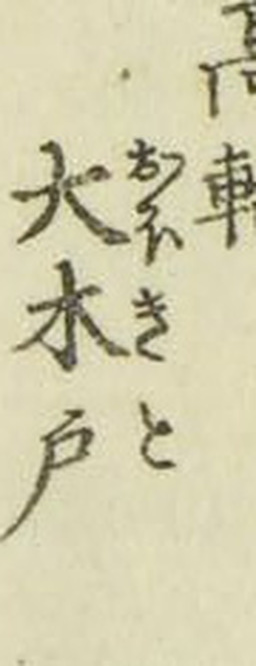大木戸
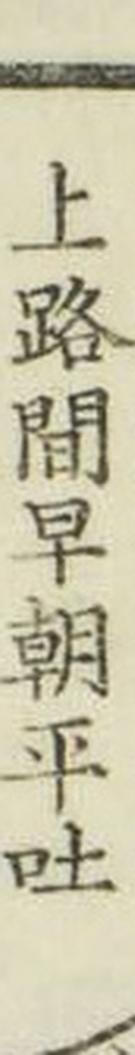上路間早朝平吐
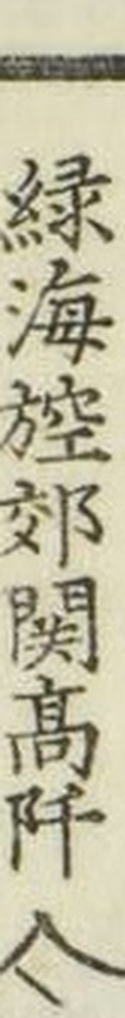緑海控郊関高阡
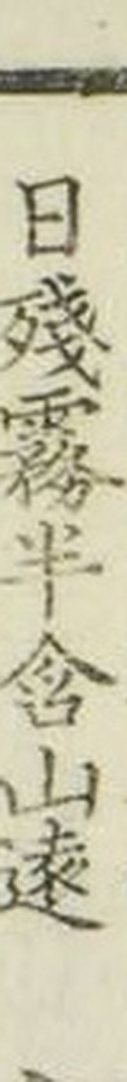日残霧半含山遠
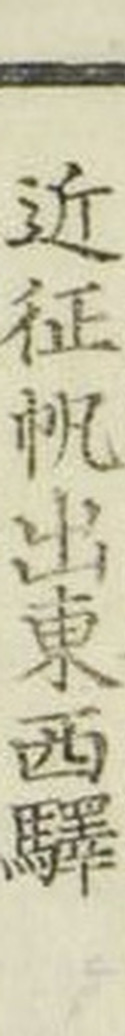近征帆出東西驛
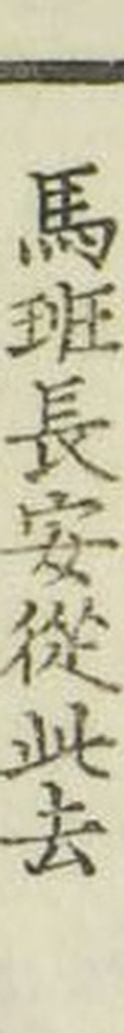馬班長安従此去
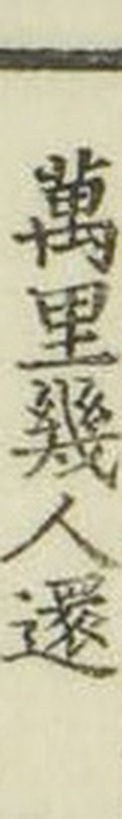萬里幾人還

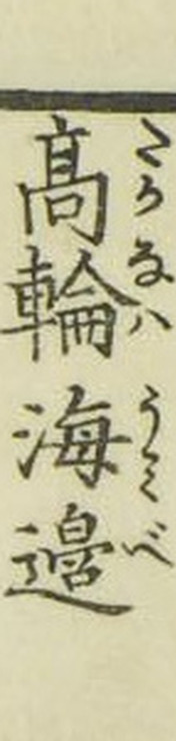高輪海邊
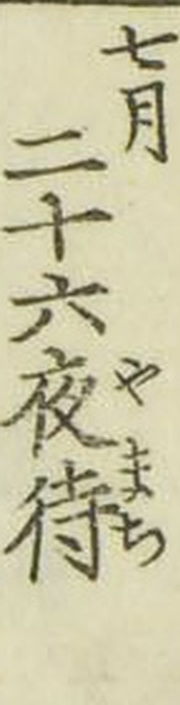二十六夜待

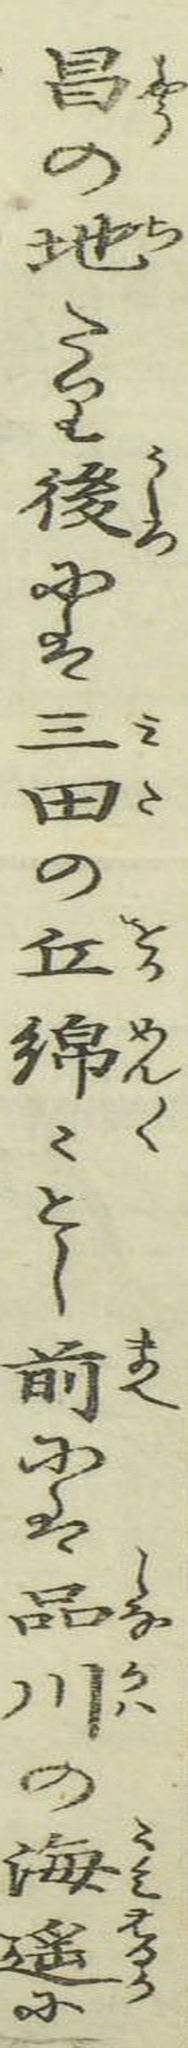昌の地たり後には三田の丘綿々とし前には品川の海遥に
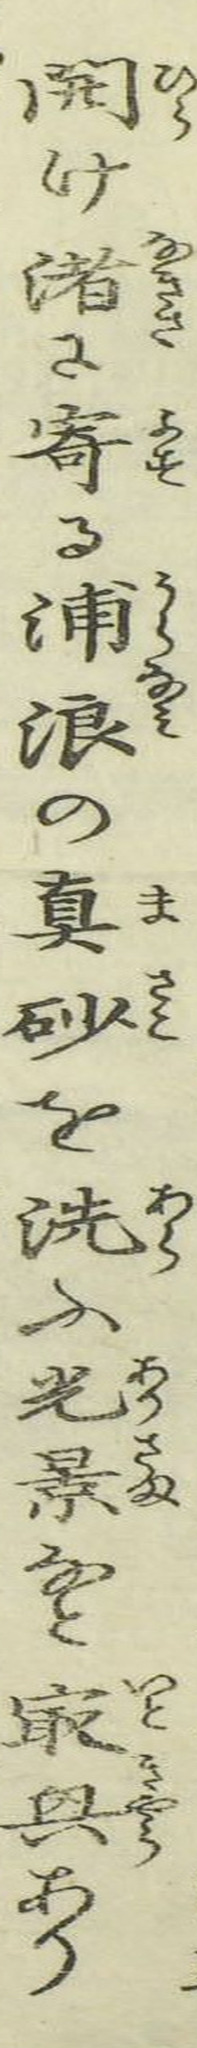開け渚に寄る浦浪の真砂を洗ふ光景なと最興あり
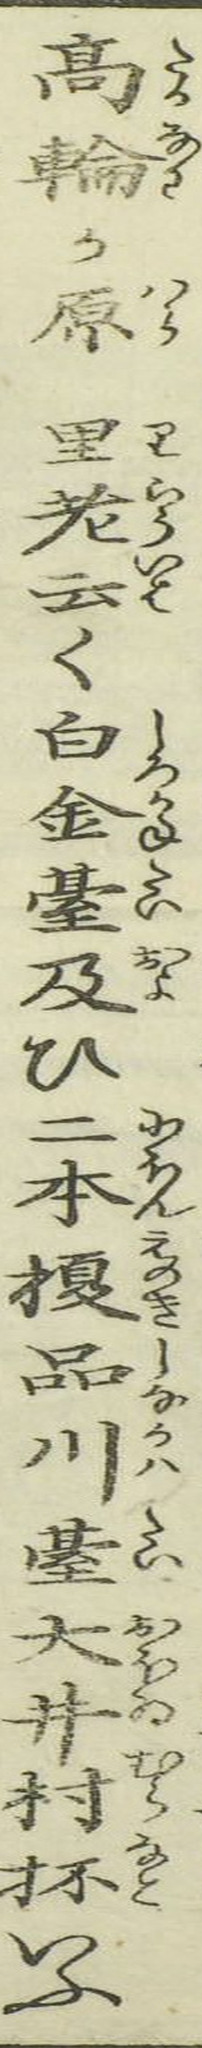高輪ゕ原里老云く白金臺及ひ二本榎品川臺大井村抔いふ
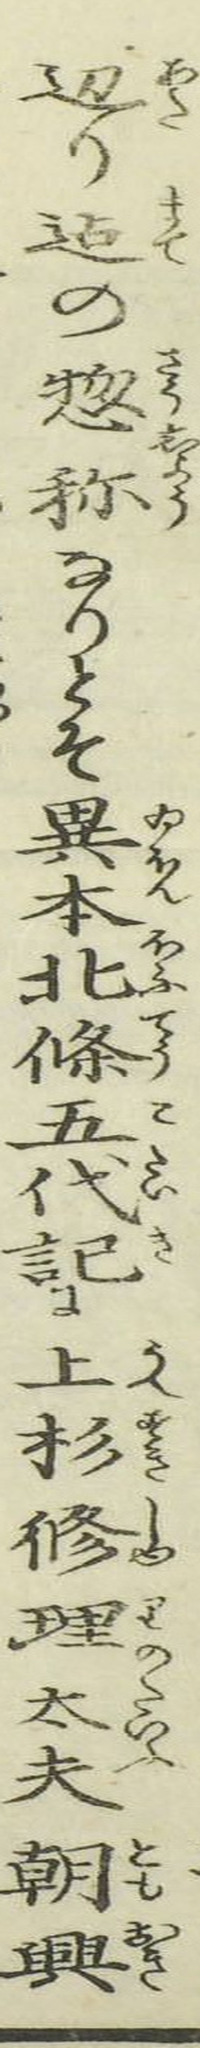辺り迄の惣称なりとそ異本北條五代記に上杉修理太夫朝興
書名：江戸名所図会 20巻 巻之3
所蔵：東京学芸大学教育コンテンツアーカイブ
